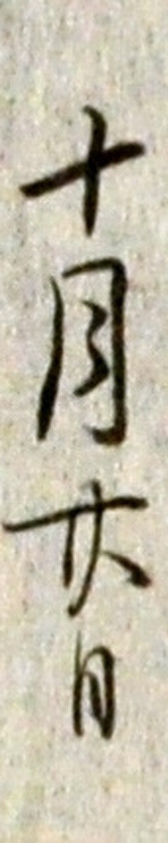十月廿日
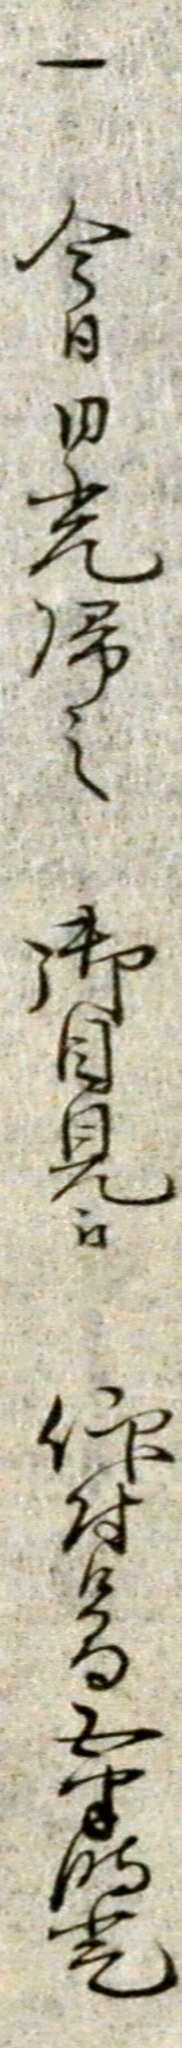一今日日光帰之御目見被仰付候間五半時登
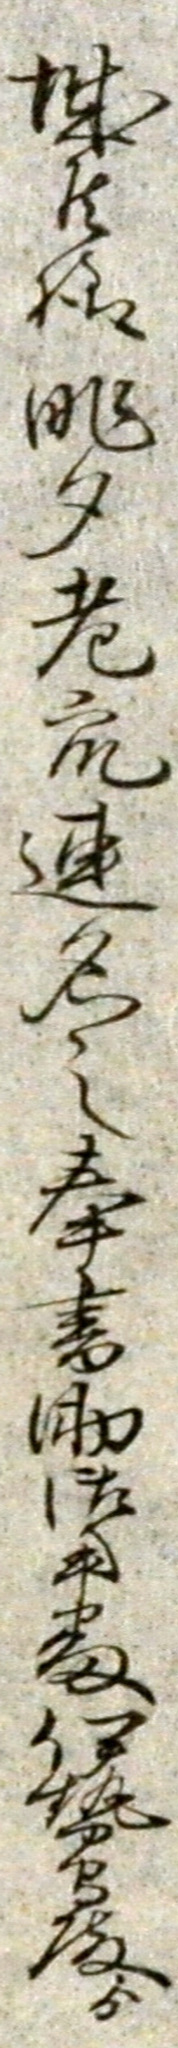城候様昨夕老衆連名之奉書助御用番伊勢守殿ゟ
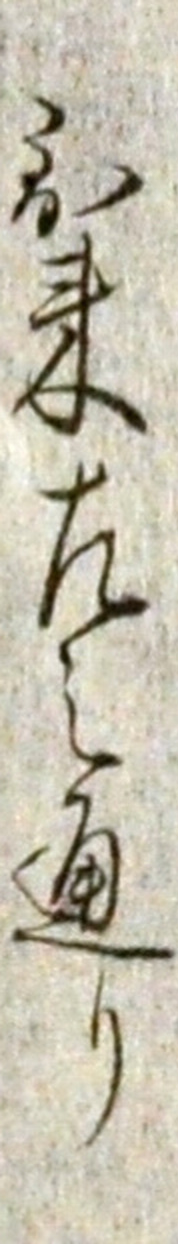到来左之通り
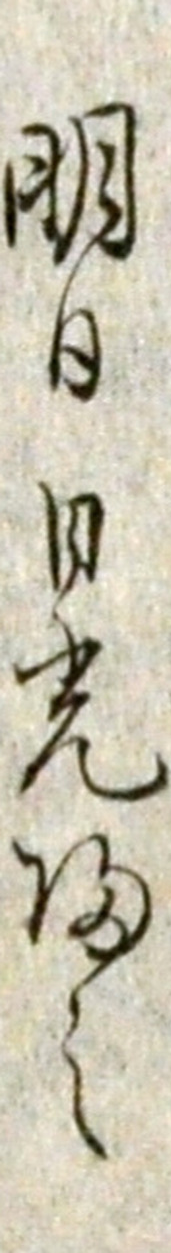明日日光帰之
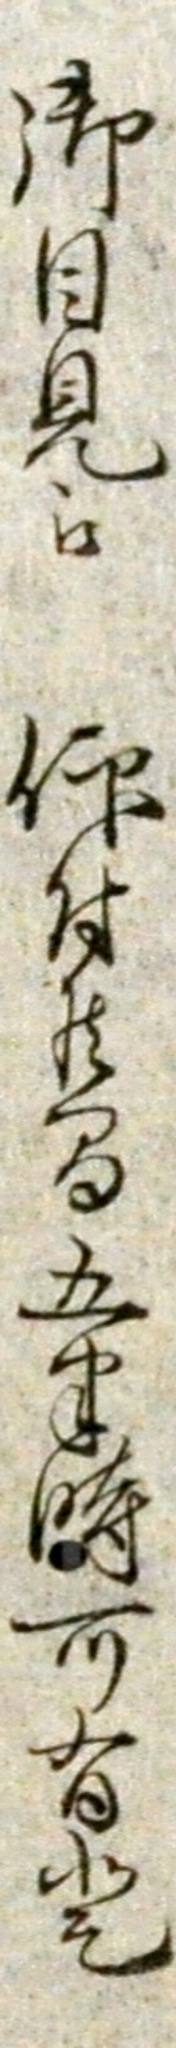御目見被仰付候間五半時可有登
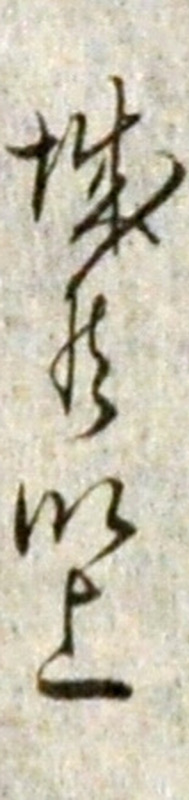城候以上
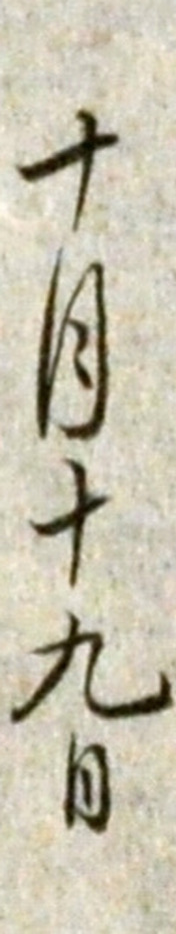十月十一日
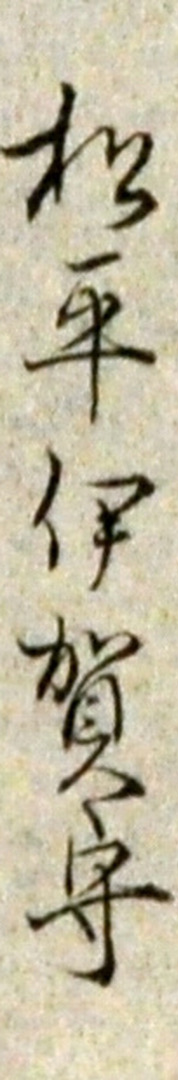松平伊賀守

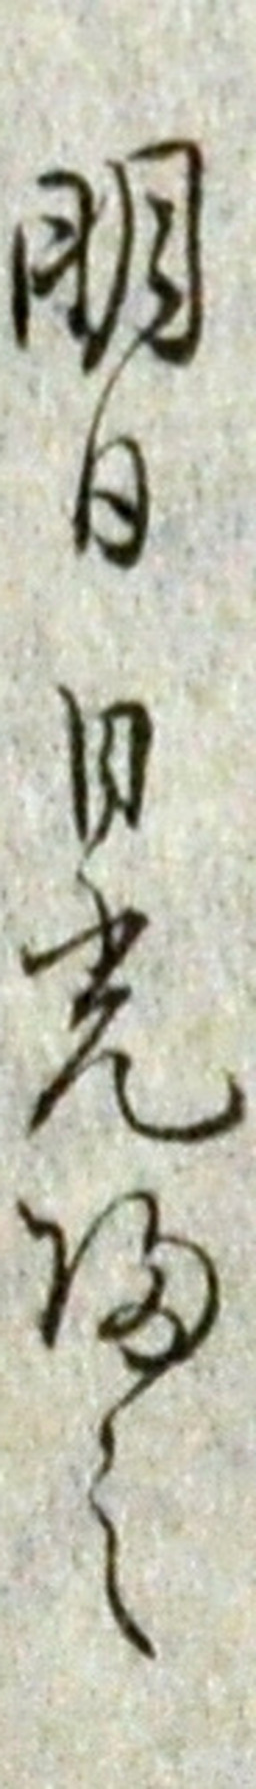明日日光帰之
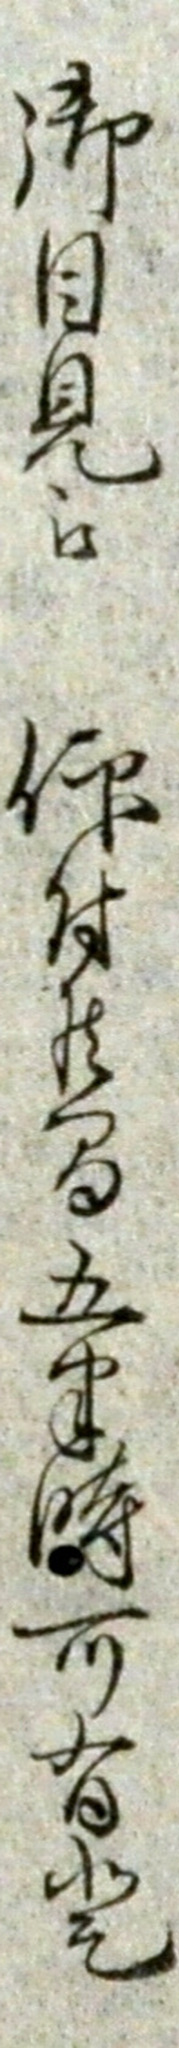御目見被仰付候間五半時可有登
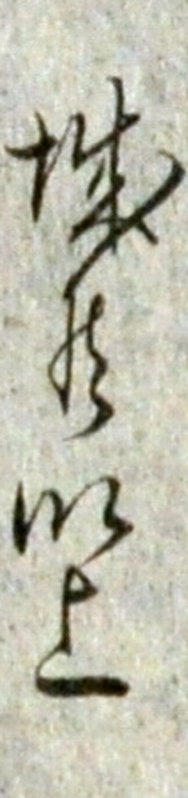城候以上
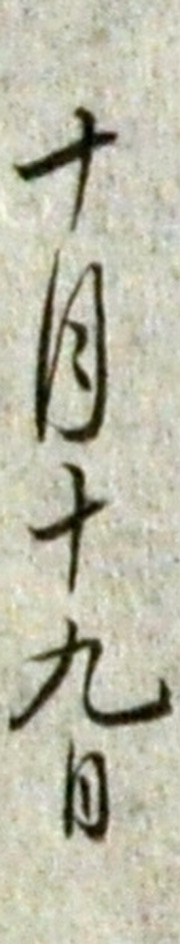十月十九日
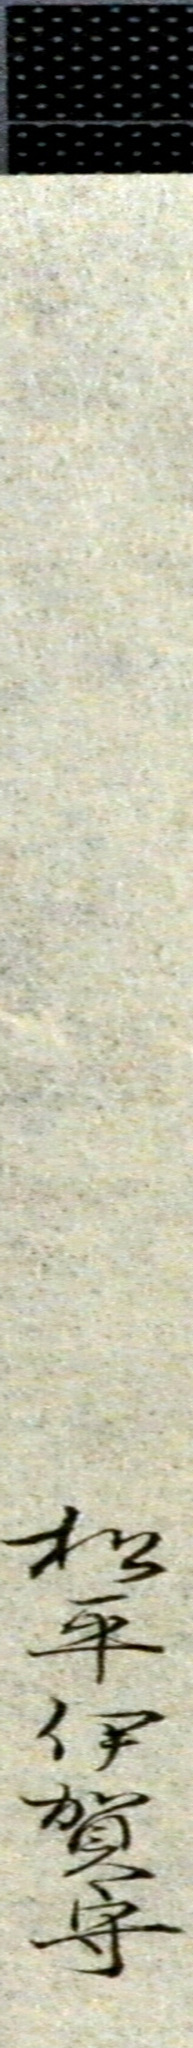松平伊賀守
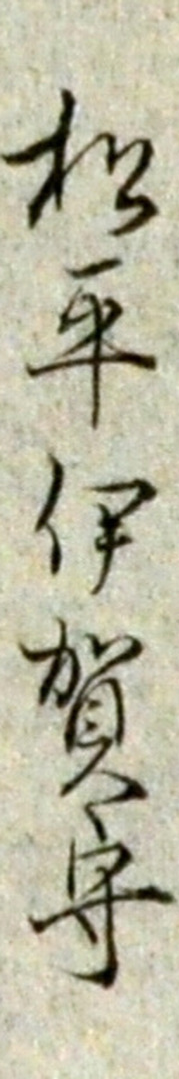松平伊賀守
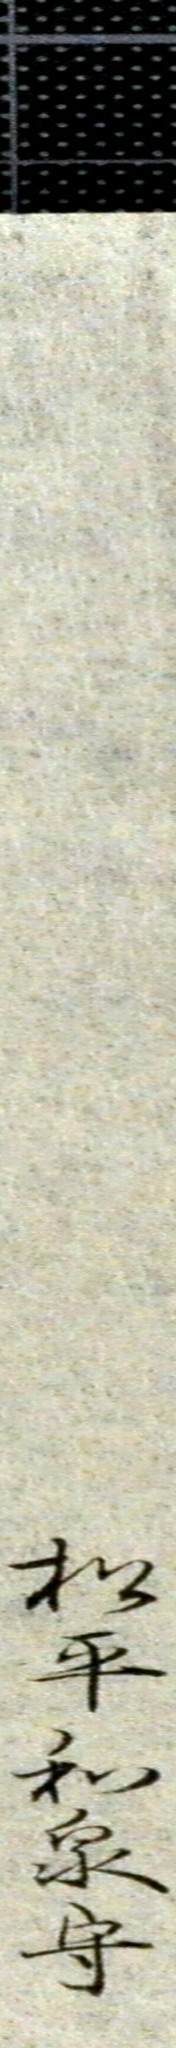松平和泉守
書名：日光御名代相勤候節ノ留
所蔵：伊那市立高遠町図書館・合同会社AMANE
